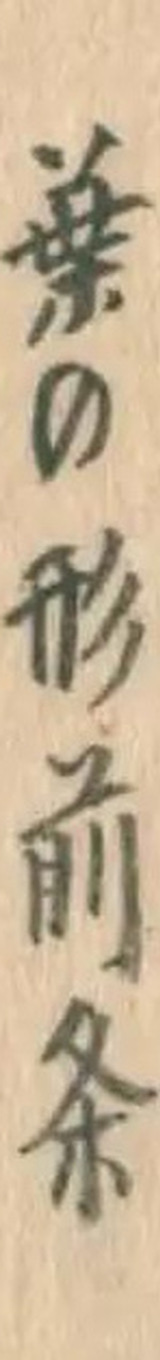葉の形前条
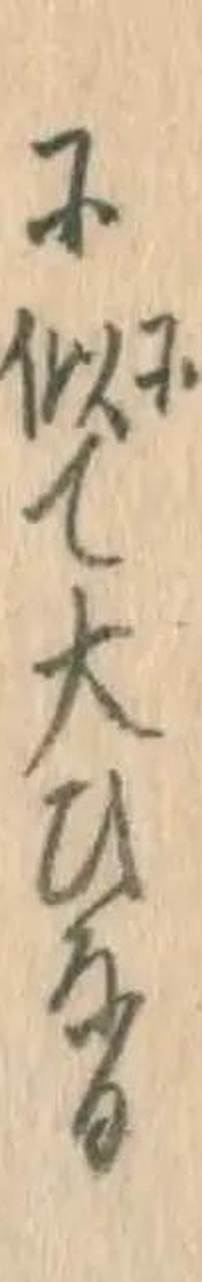に似て大ひなる
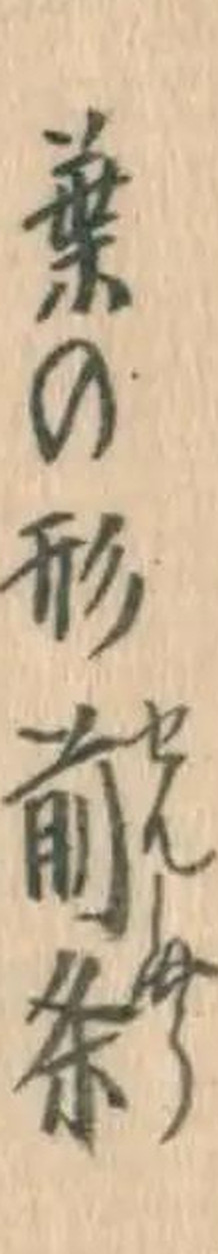葉の形前条
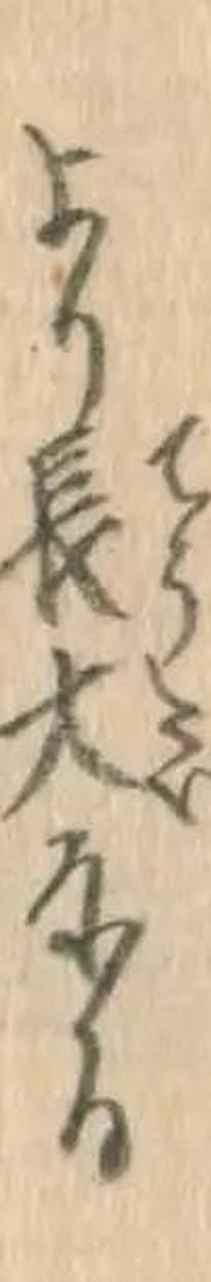より長大なる
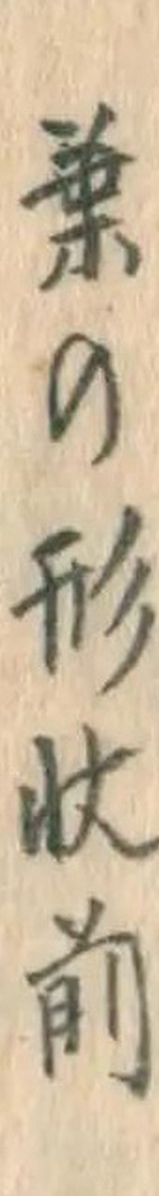葉の形状前
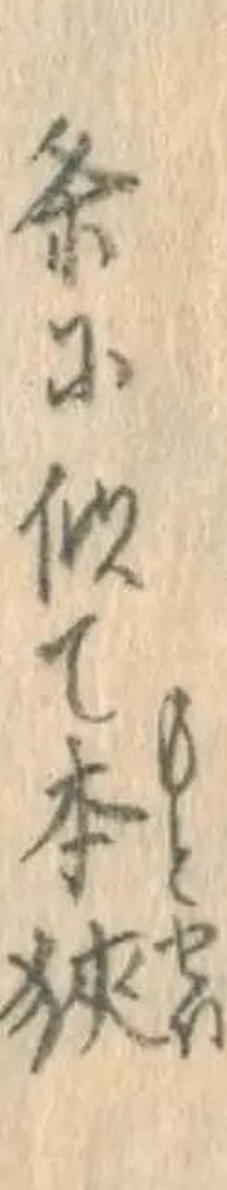条に似て本狭
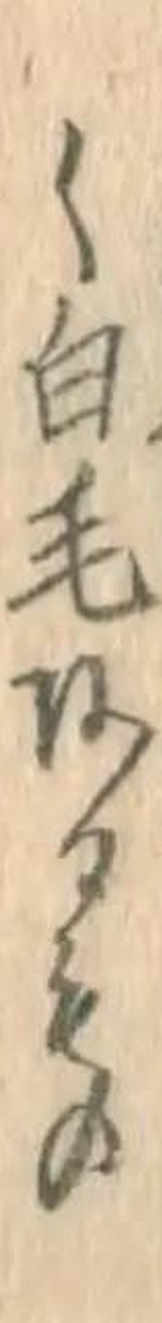く白毛あるもの

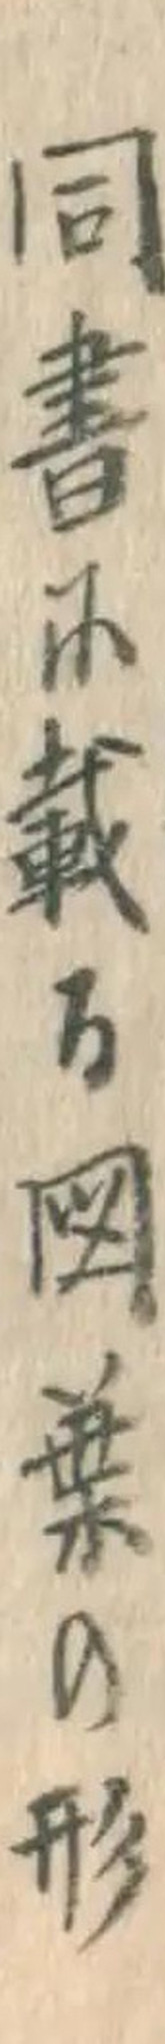同書に載る図葉の形
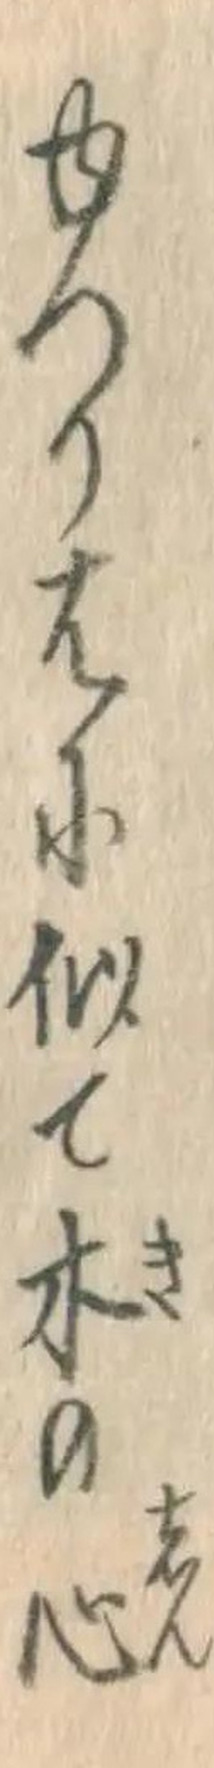ゆつりはに似て木の心
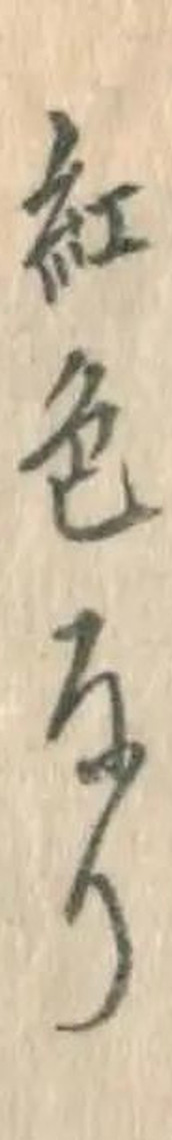紅色なり

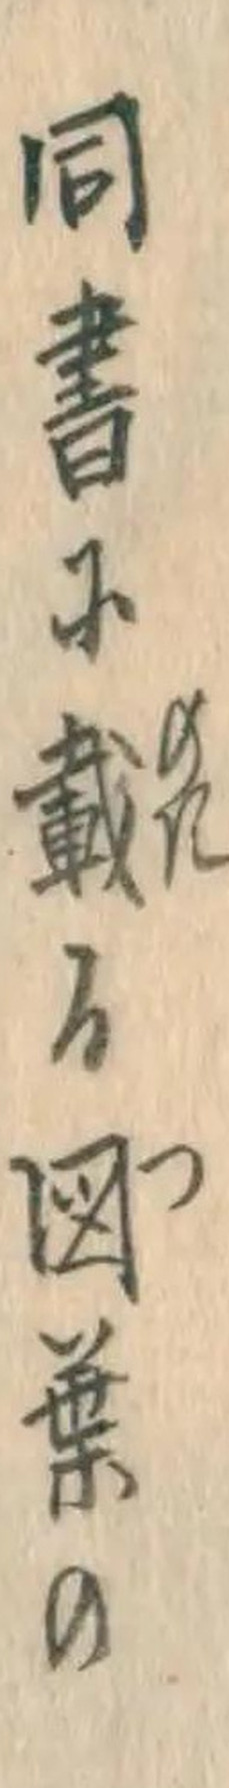同書に載る図葉の
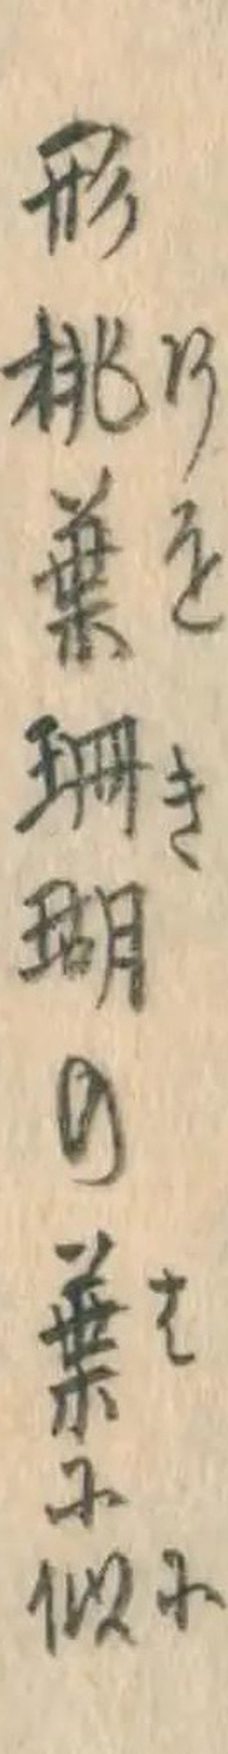形桃葉珊瑚の葉に似
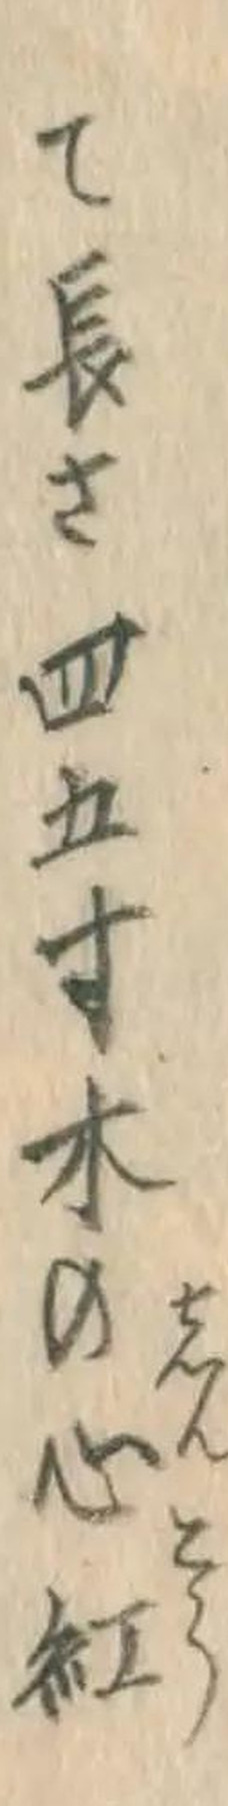て長さ四五寸木の心紅
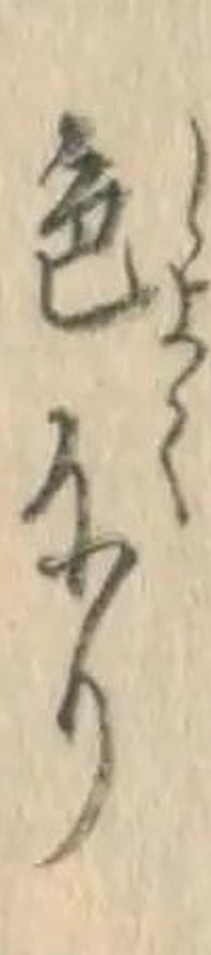色なり

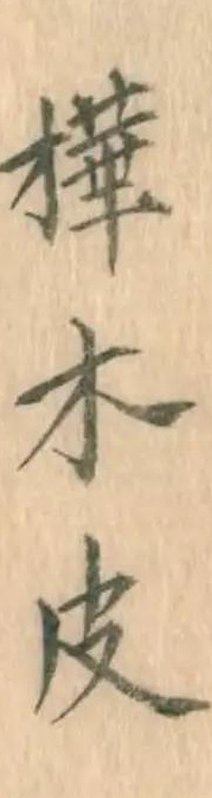樺木皮

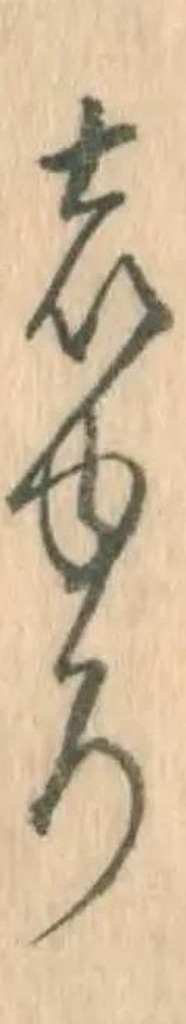しゆろ
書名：本草図譜. 巻85-87
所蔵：国立国会図書館 National Diet Library, JAPAN
